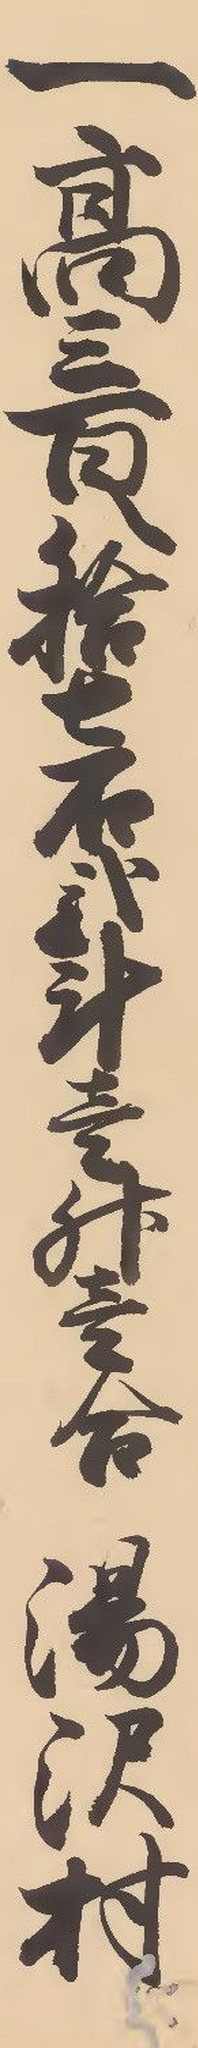一高三百八拾七石弐斗壱升壱合湯沢村
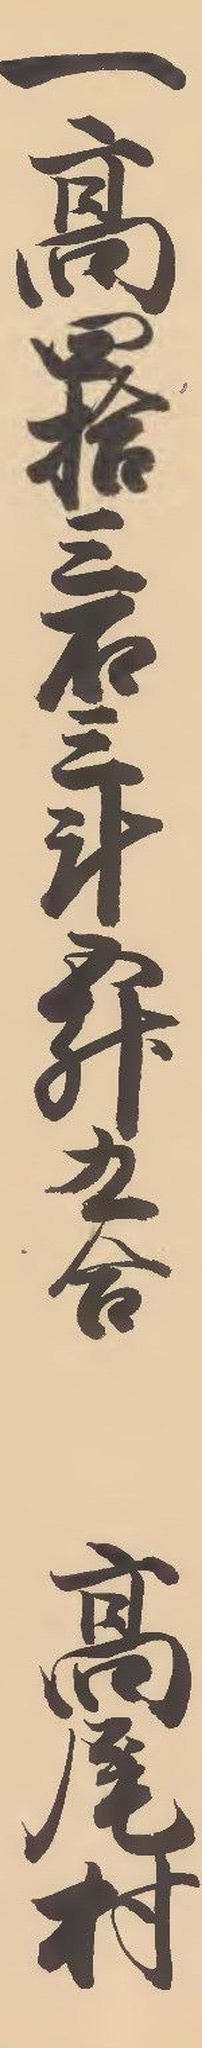一高四拾三石三斗五升九合高尾村
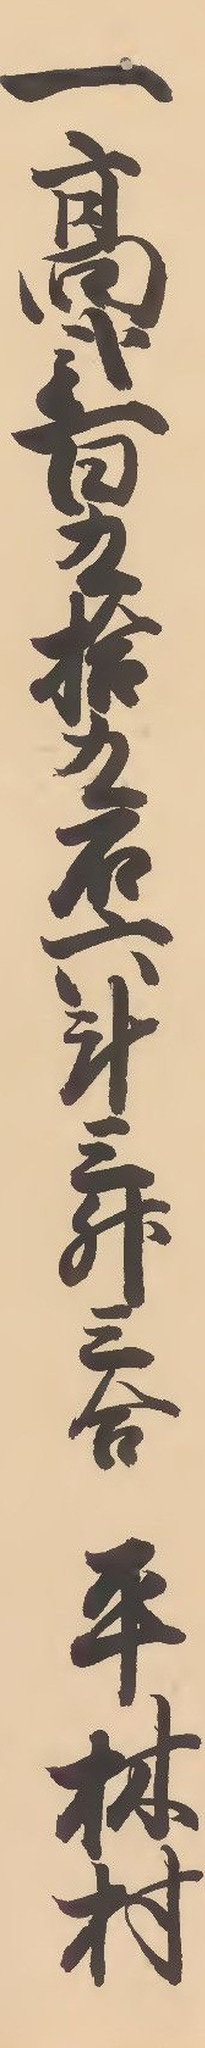一高弐百九拾九石六斗三升三合平林村
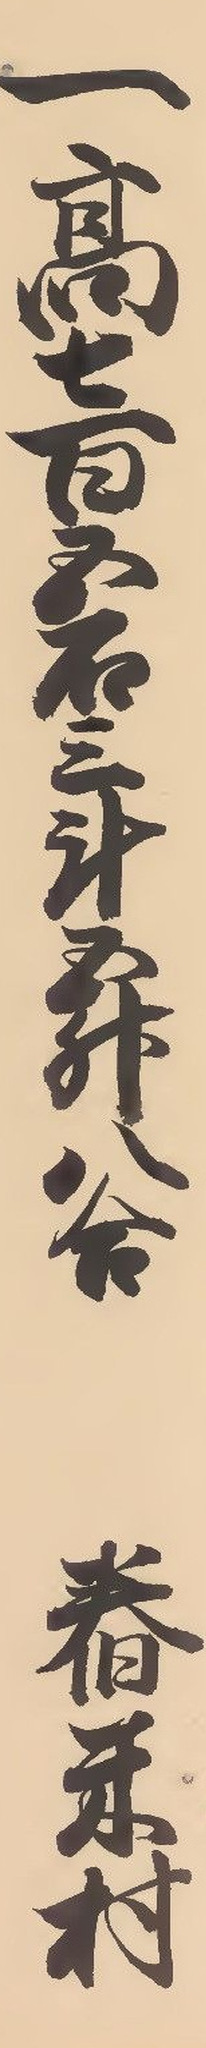一高七百五石三斗五升八合舂米村
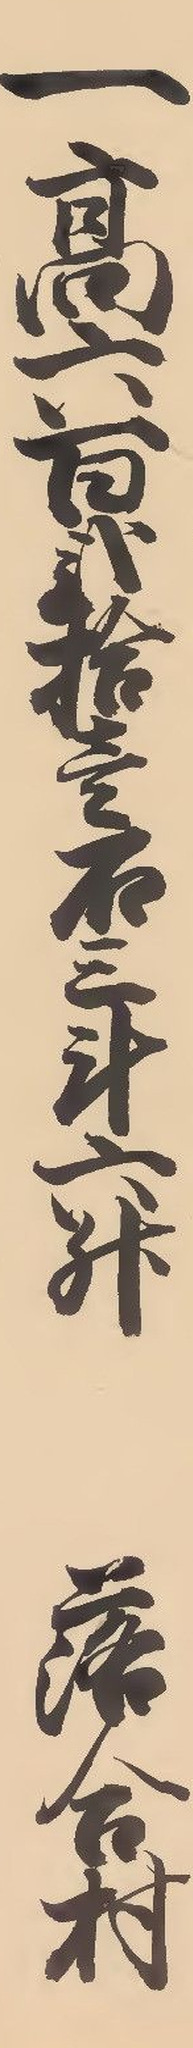一高六百弐拾壱石三斗六升落合村
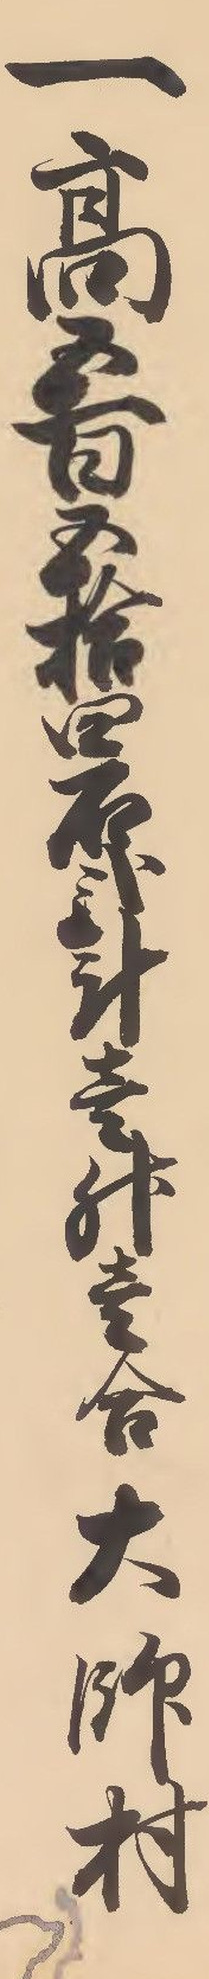一高五百五拾四石弐斗壱升壱合大師村
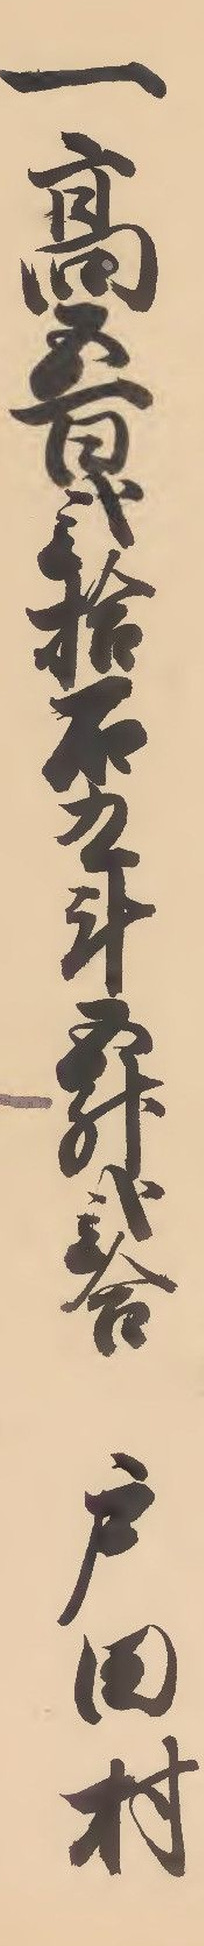一高五百弐拾石九斗五升弐合戸田村

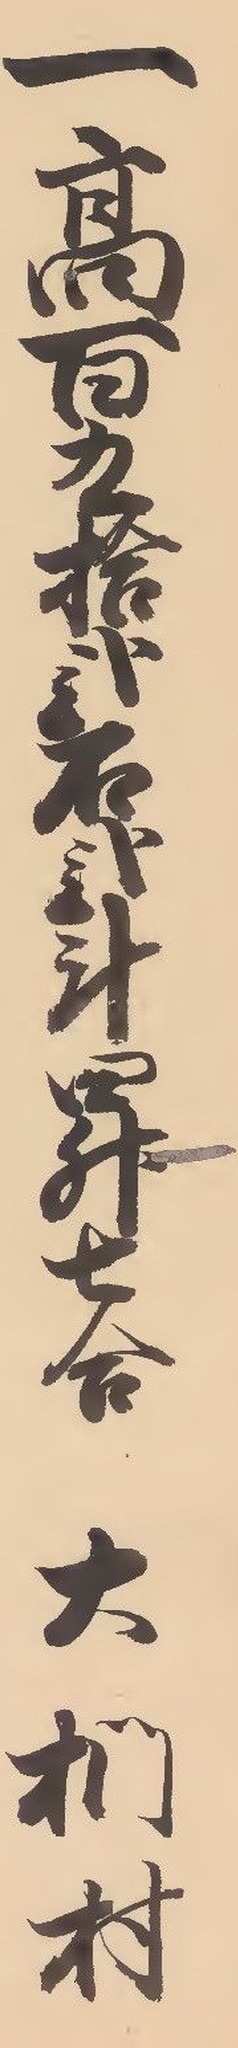一高百九拾弐石弐斗四升七合大椚村
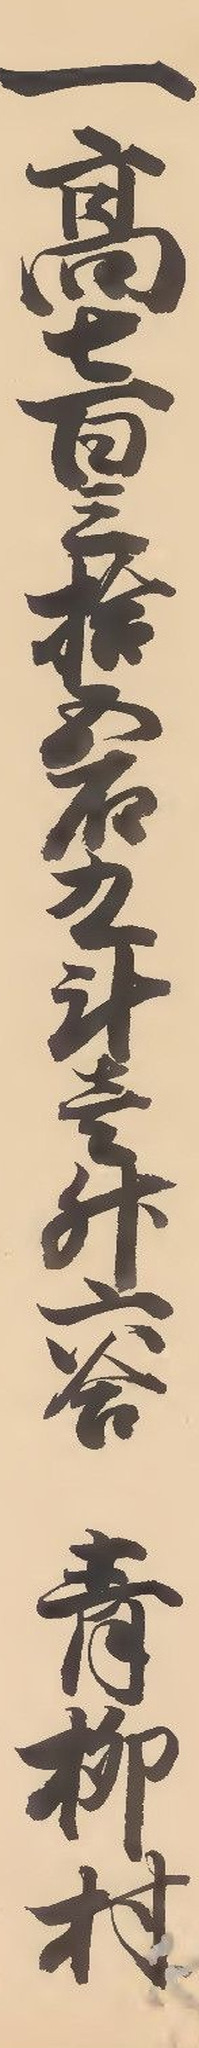一高七百三拾五石九斗壱升六合青柳村
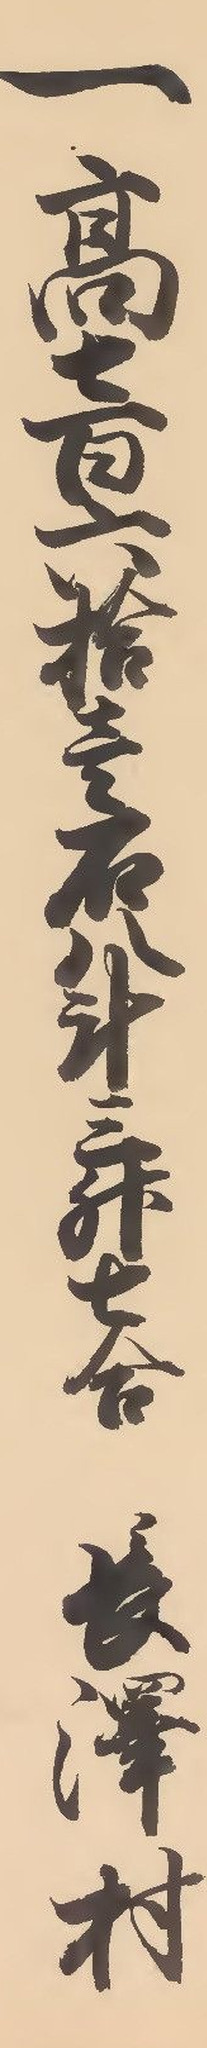一高七百六拾壱石八斗三升七合長沢村
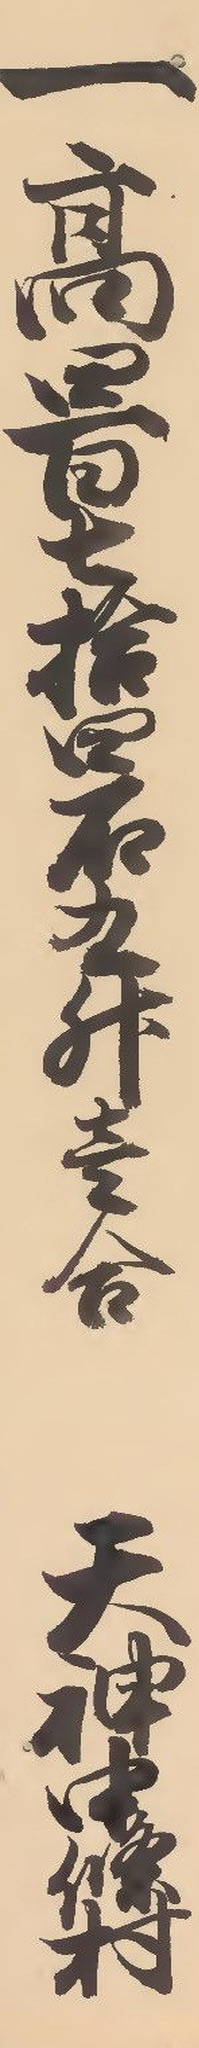一高四百七拾四石九升壱合天神中条村
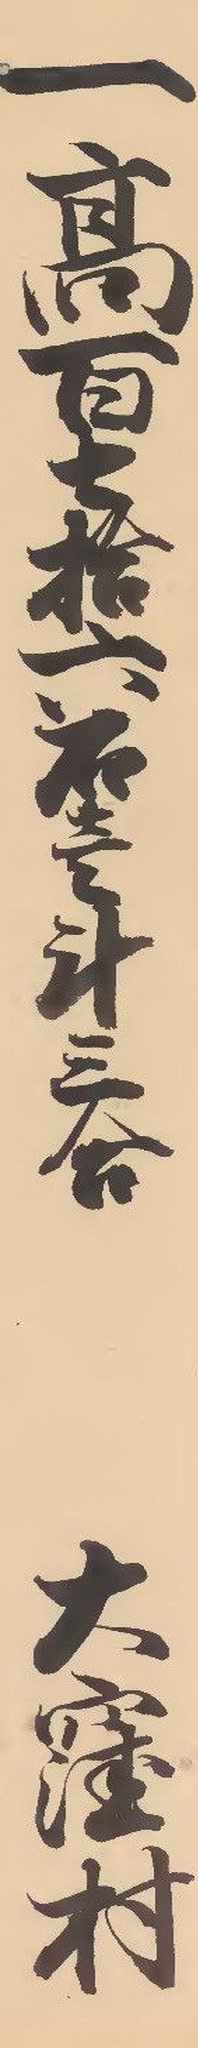一高百七拾六石壱斗三合大窪村
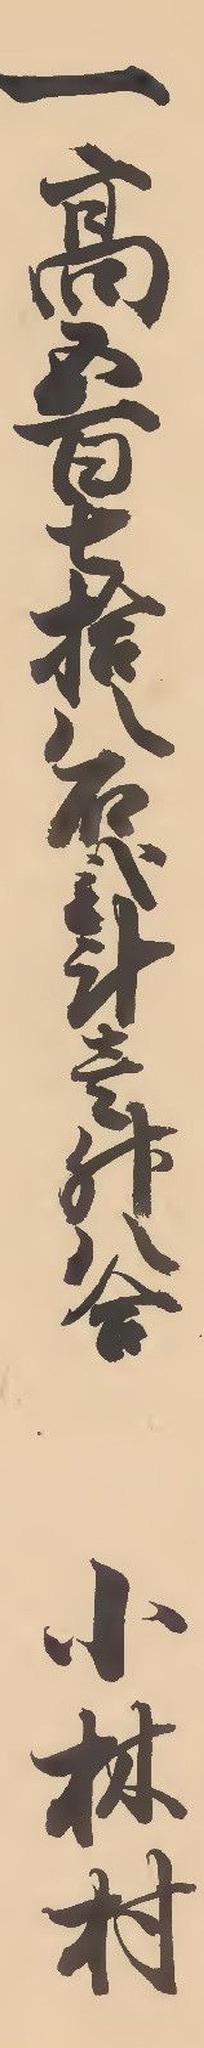一高五百七拾八石弐斗壱升八合小林村
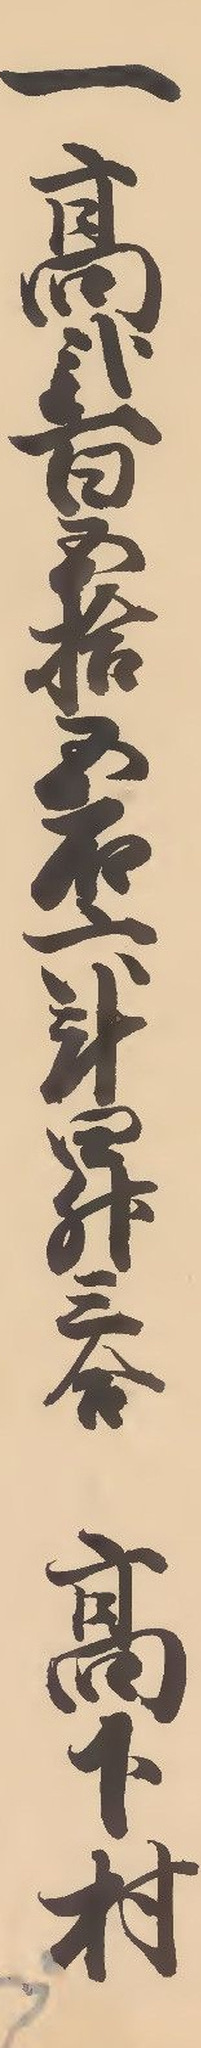一高弐百五拾五石六斗四升三合高下村
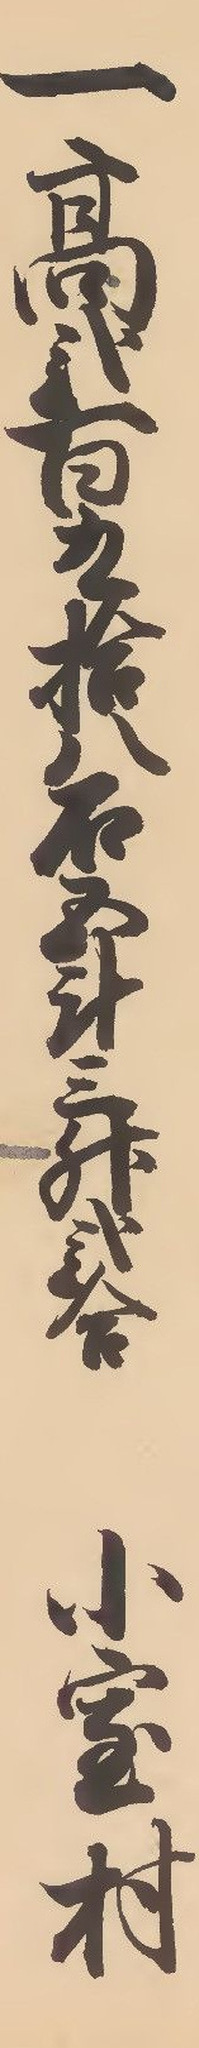一高弐百九拾八石五斗三升弐合小室村

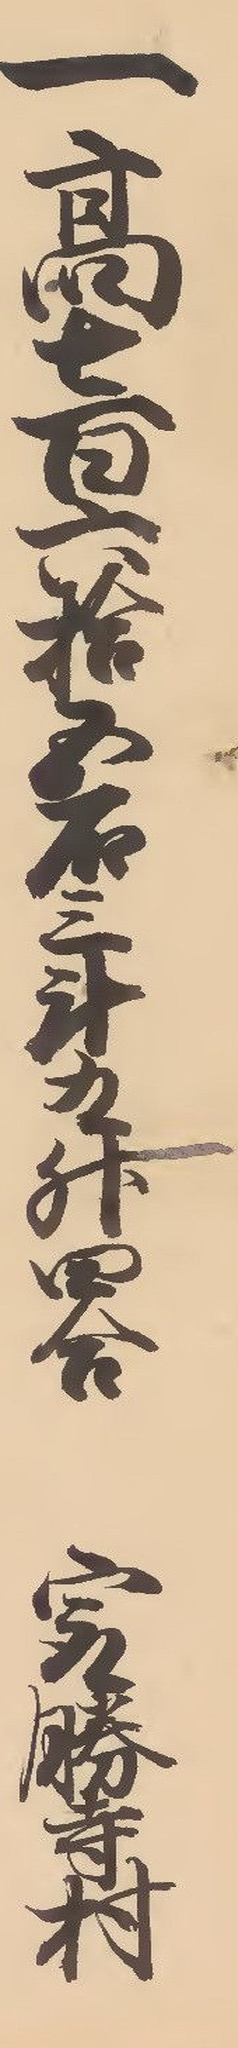一高七百六拾五石三斗九升四合最勝寺村
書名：甲斐国郷帳
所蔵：国立公文書館 National Archives of Japan
